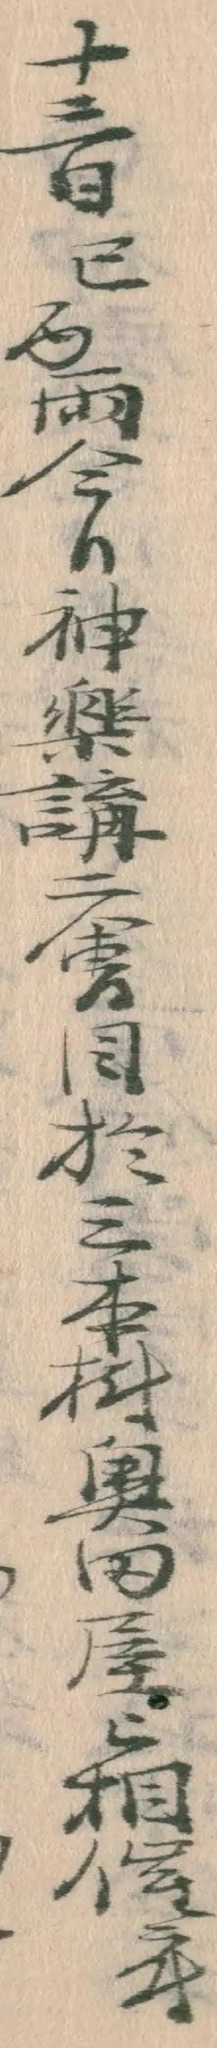十三日己酉雨今日神楽講二会目於三本樹奥田屋被相催ニ付
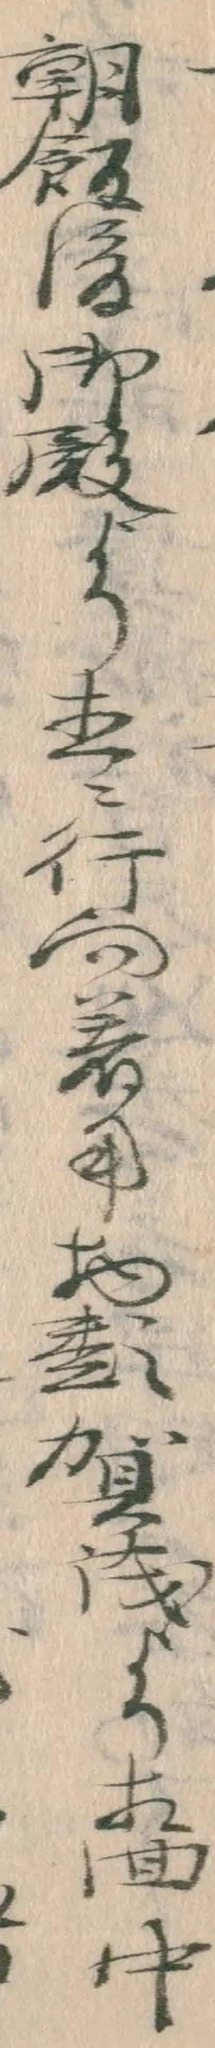朝飯後御殿より直ニ行向着用物類賀茂より相回中
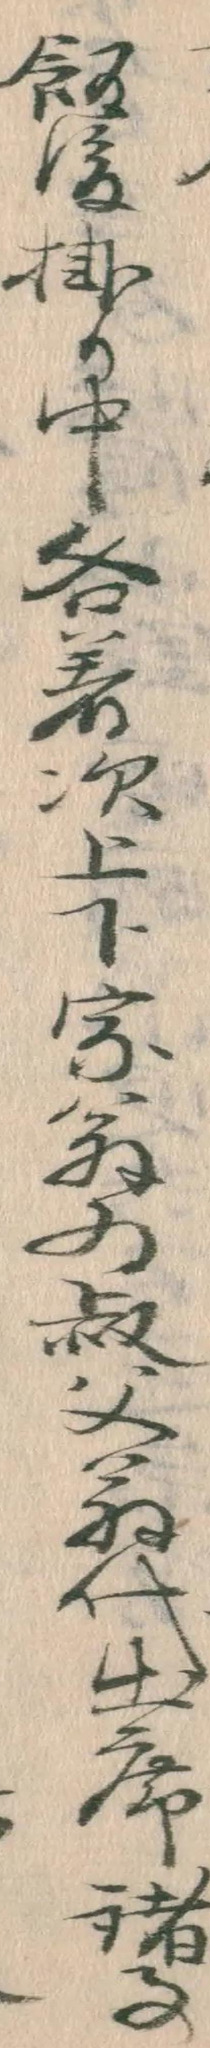飯後掛り中各着次上下家翁為叔父翁代出席諸事
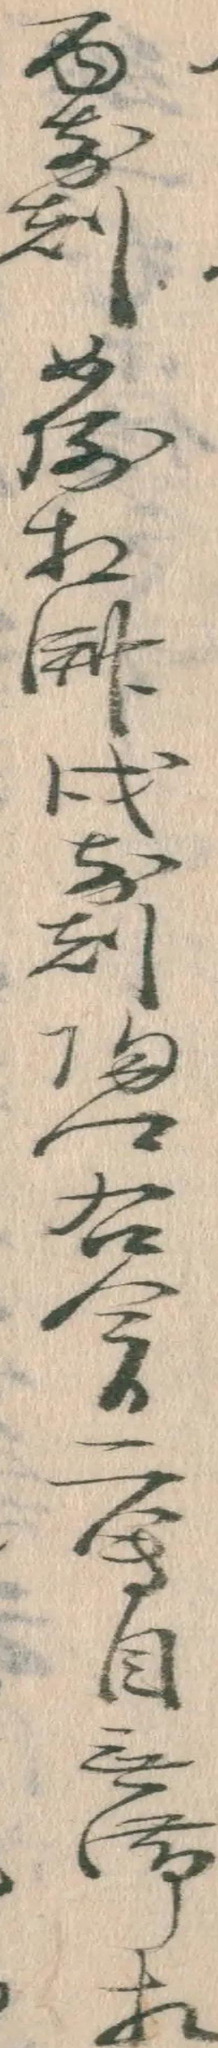酉前刻如例相済戌前刻帰郷右今日二会目無滞相
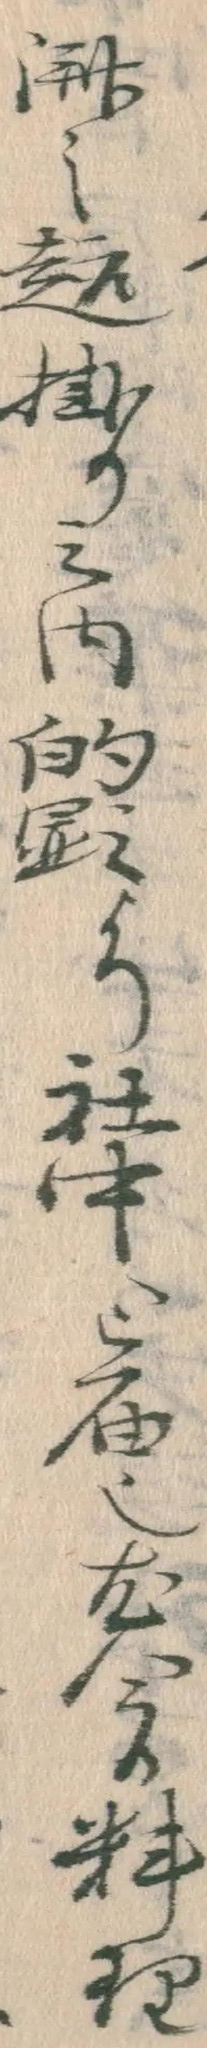済之趣掛り之内的顕より社中へ被届也尤今日料理
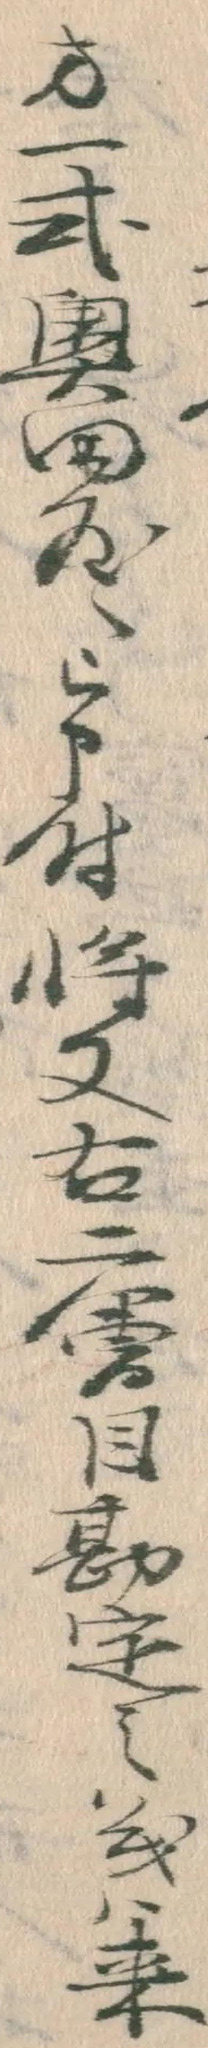方一式奥田屋へ被申付将又右二会目勘定之義ハ来
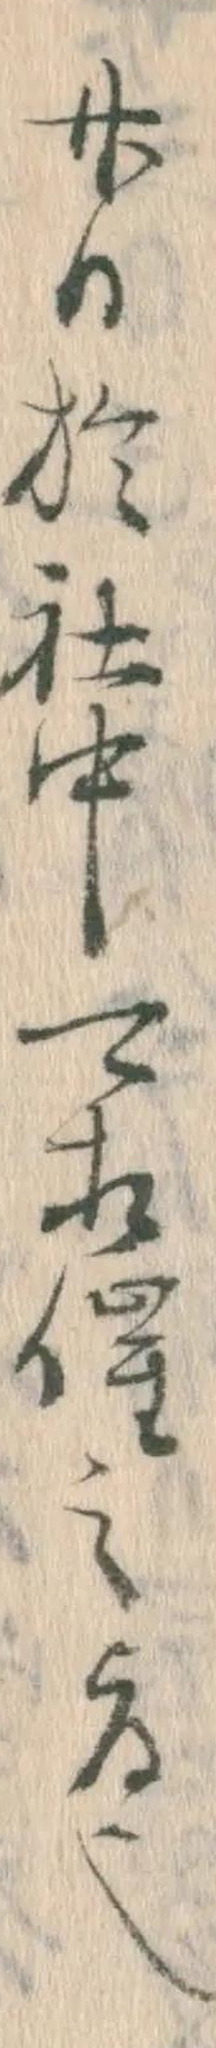廿日於社中可相催之旨也
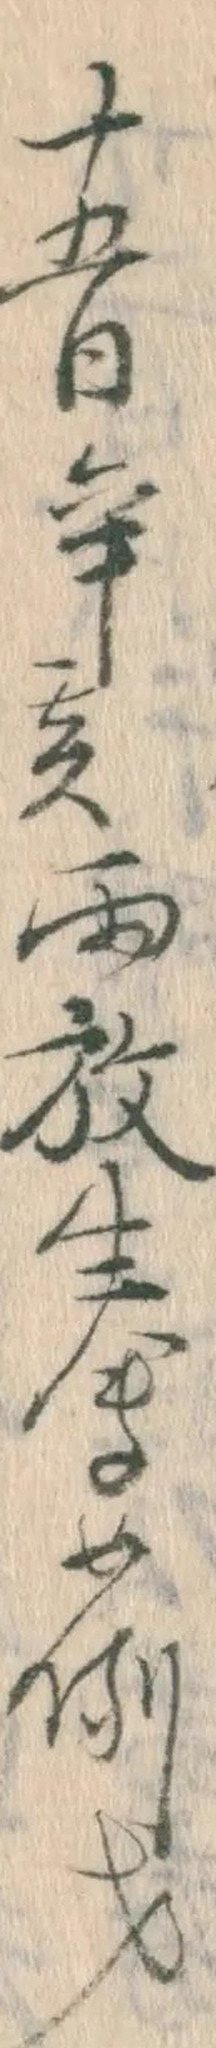十五日辛亥雨放生会如例才
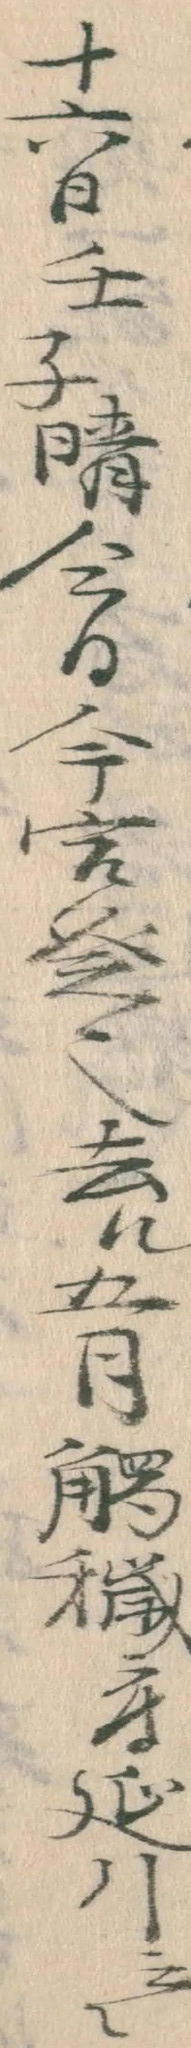十六日壬子晴今日今宮祭也去ル五月触穢ニ付延引云々
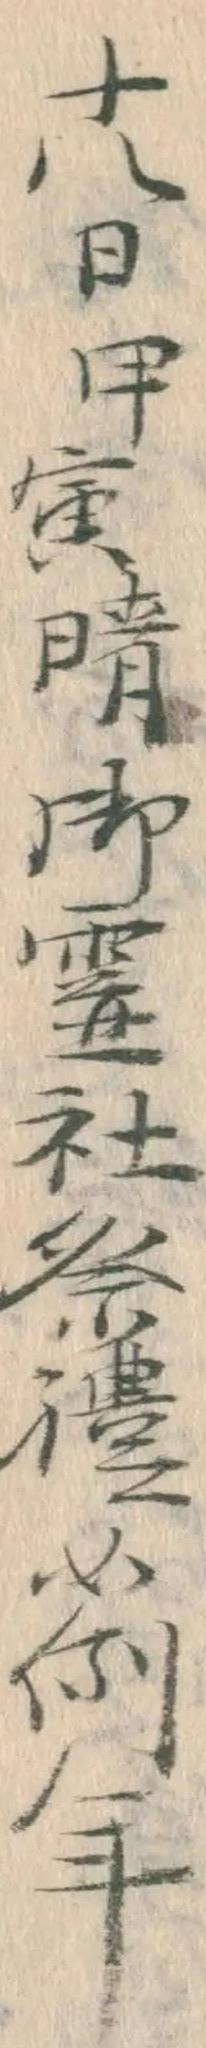十八日甲寅晴御霊社祭礼如例年
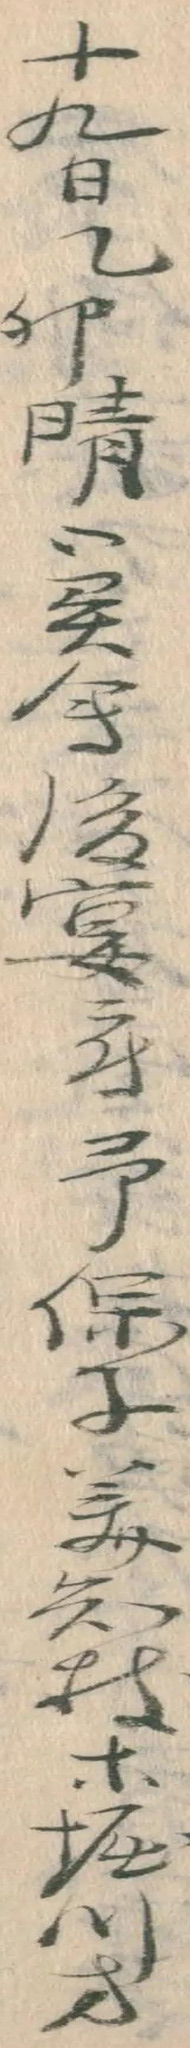十九日乙卯晴御霊会後宴ニ付予保子美知枝等堀川方
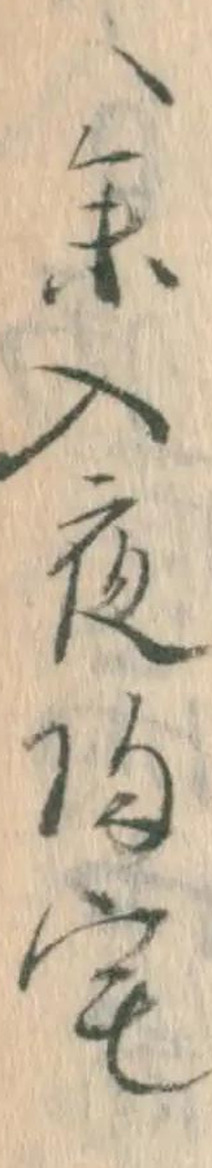へ参入夜帰宅

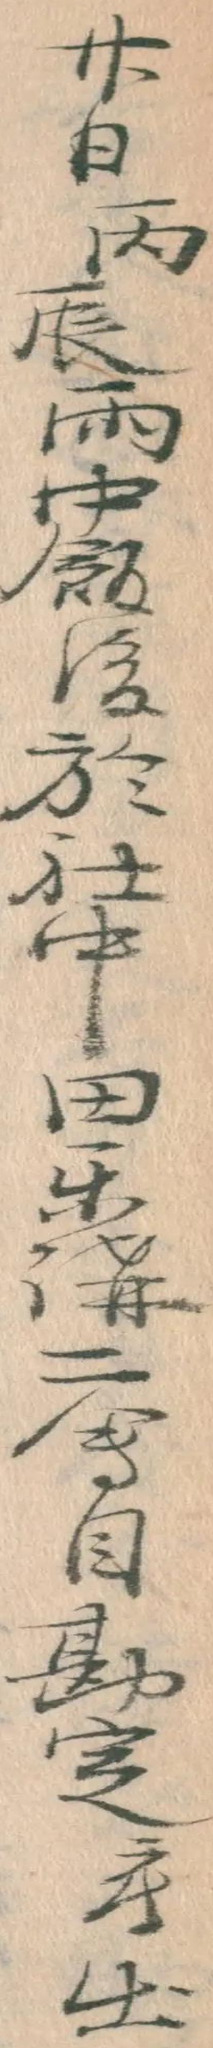廿日丙辰雨中飯後於社中田楽講二会目勘定ニ付出
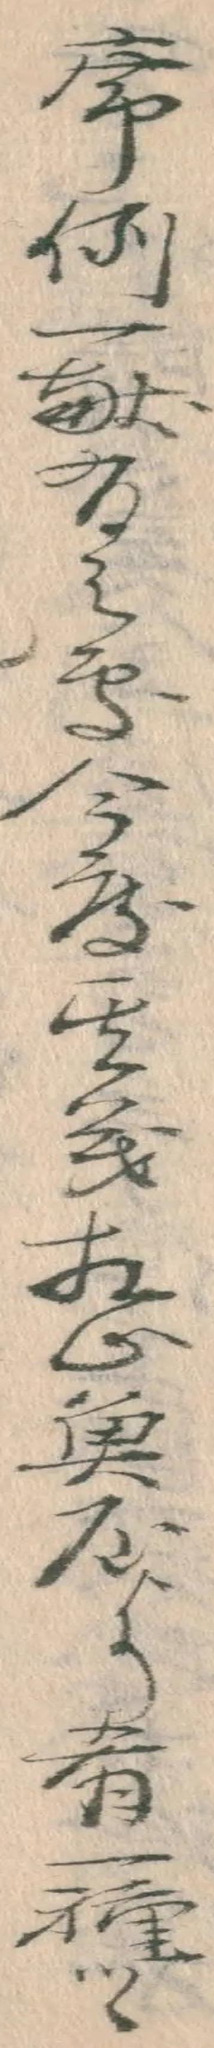席例一献有之処今度其義相止魚屋より肴一種ツヽ
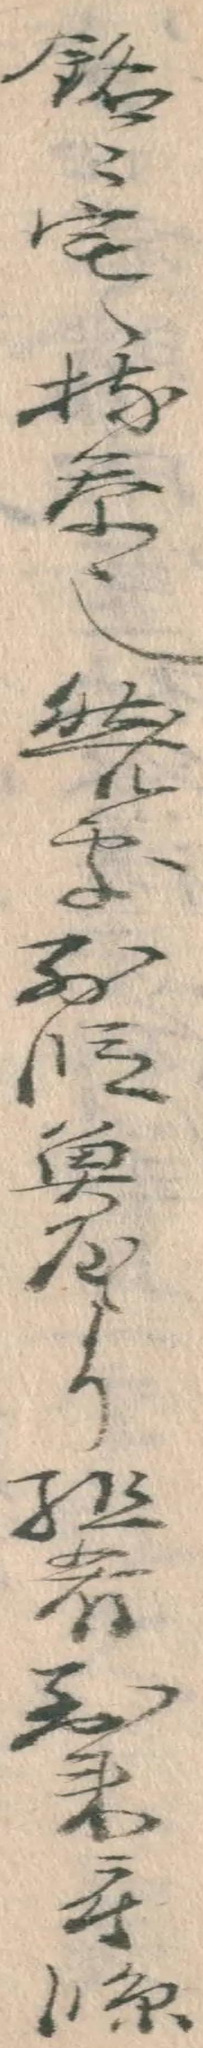銘々宅へ持参也然ル処別段魚屋より組肴到来ニ付臨
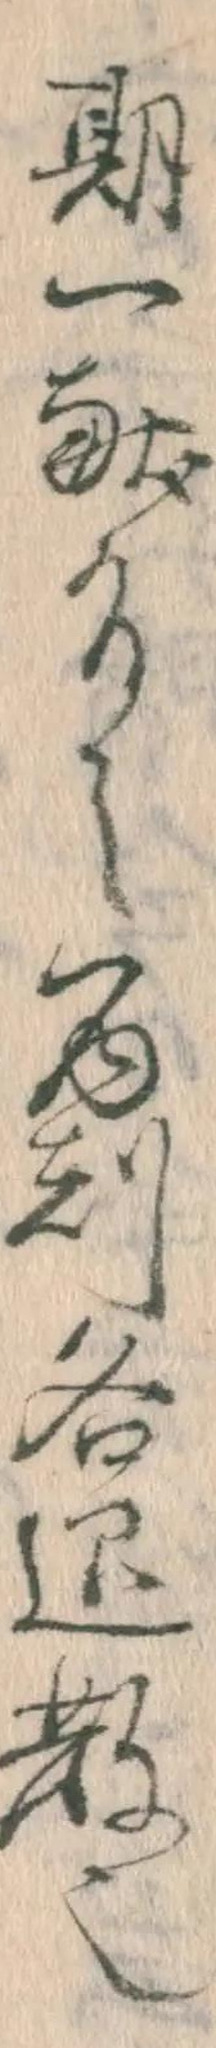期一献有之酉刻各退散也
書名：賀茂社記録. 第64冊
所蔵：国立国会図書館 National Diet Library, JAPAN
